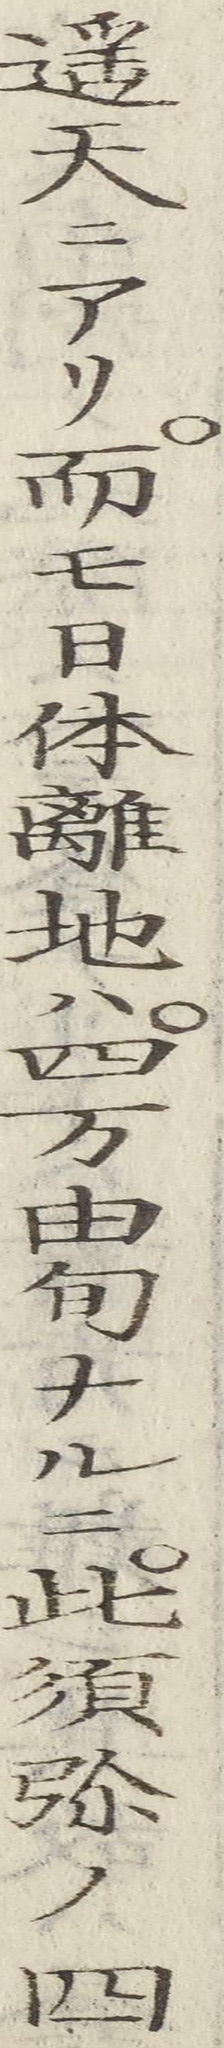遥天ニアリ。而モ日体離地ハ。四万由旬ナルニ。此須弥ノ四
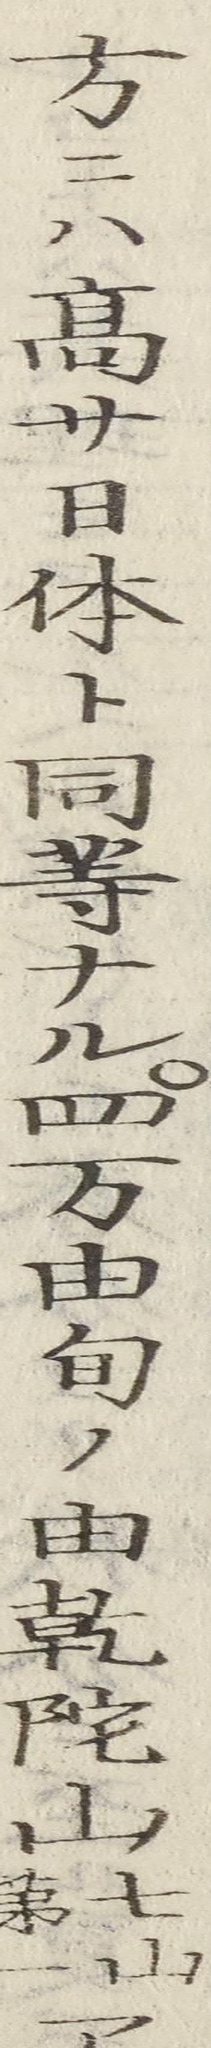方ニハ高サ日体ト同等ナル。四万由旬ノ由乾陀山七山第一ア
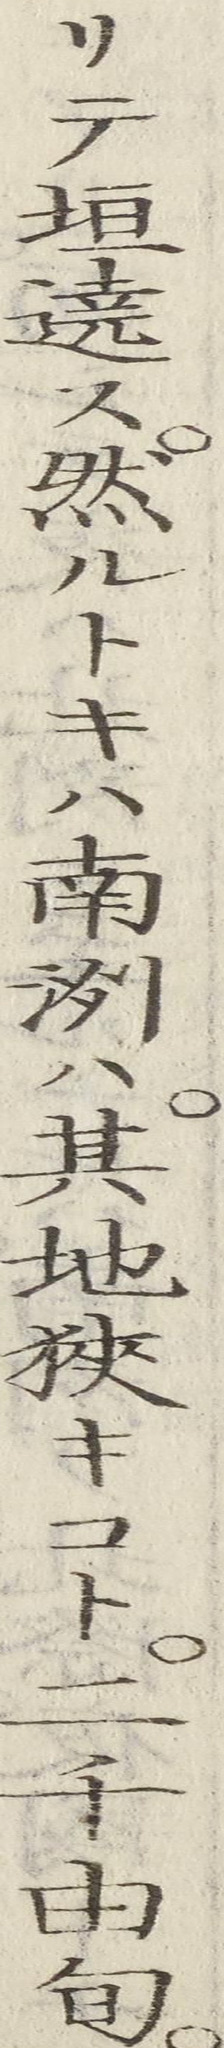リテ垣遶ス。然ルトキハ南洲ハ。其地狭キコト。ニ千由旬。
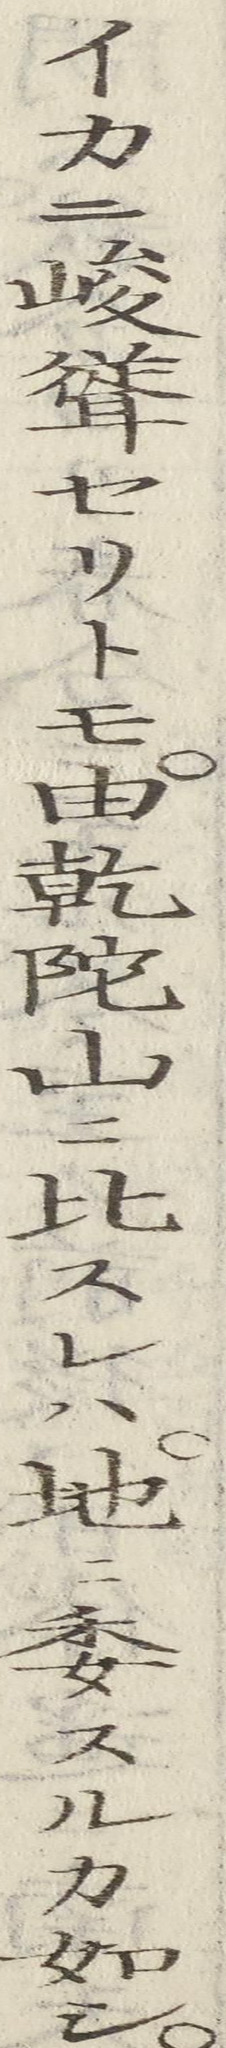イカニ峻聳セリトモ。由乾陀山ニ比スレハ。地ニ委スルカ如シ。
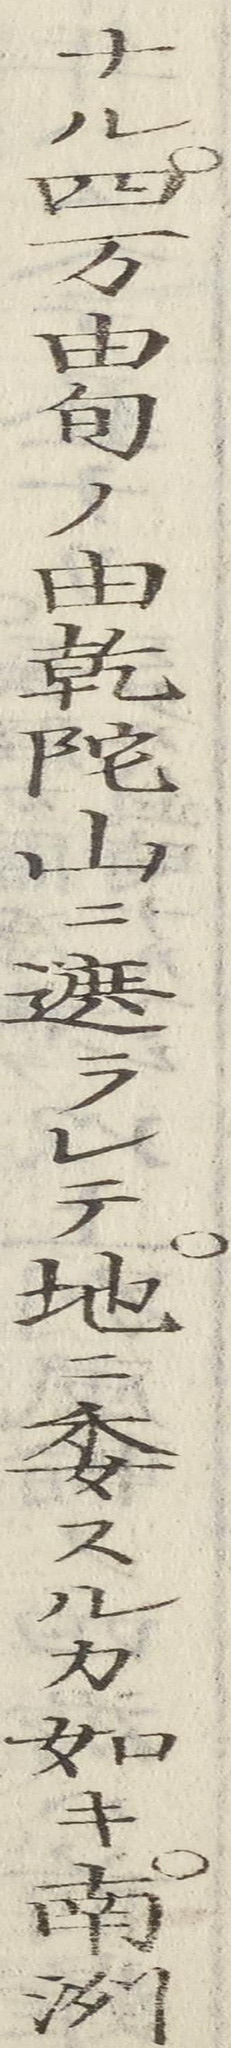ナル。四万由旬ノ由乾陀山ニ遮ラレテ。地ニ委スルカ如キ。南洲
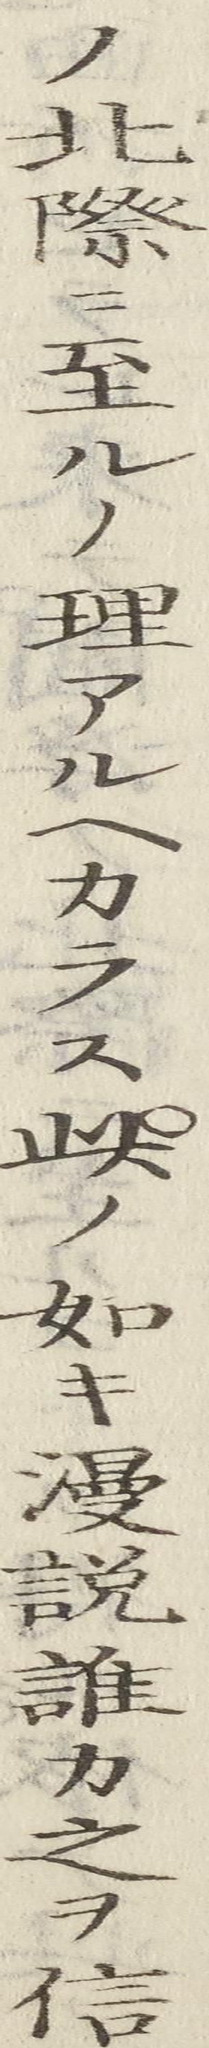ノ北際ニ至ルノ理アルヘカラス。此ノ如キ漫説誰カ之ヲ信
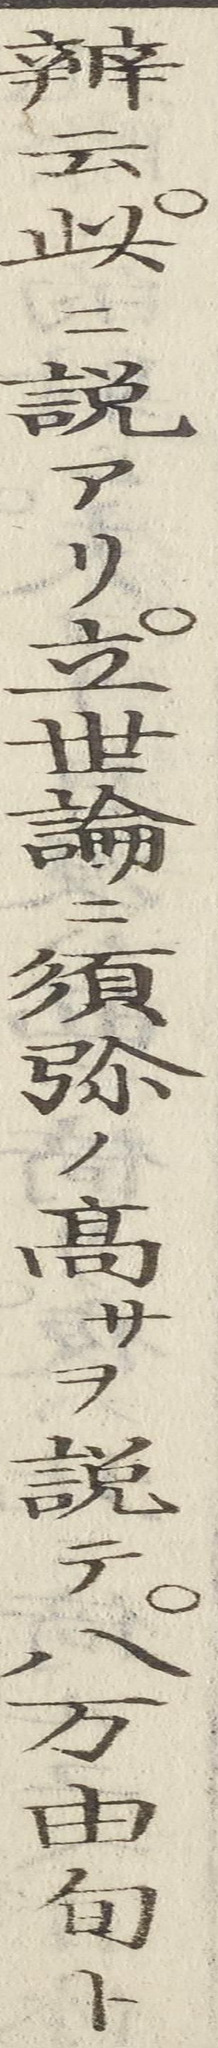弁云。此ニ説アリ。立世論ニ須弥ノ高サヲ説テ。八万由旬ト
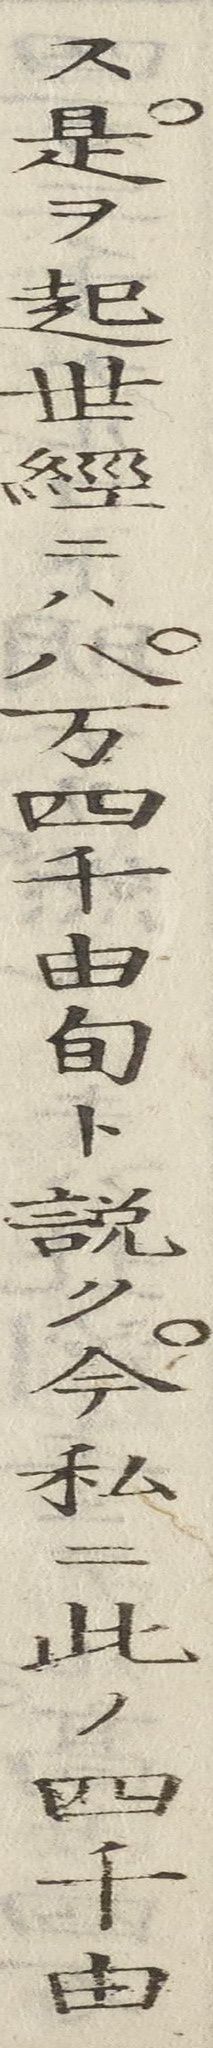ス。是ヲ起世経ニハ。八万四千由旬ト説ク。今私ニ此ノ四千由
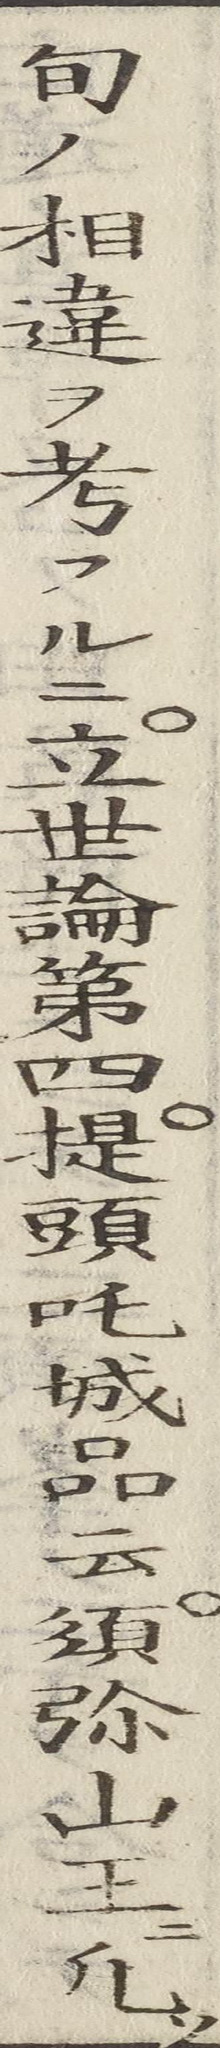旬ノ相違ヲ考フルニ。立世論第四。提頭吨城品云。須弥山王凡
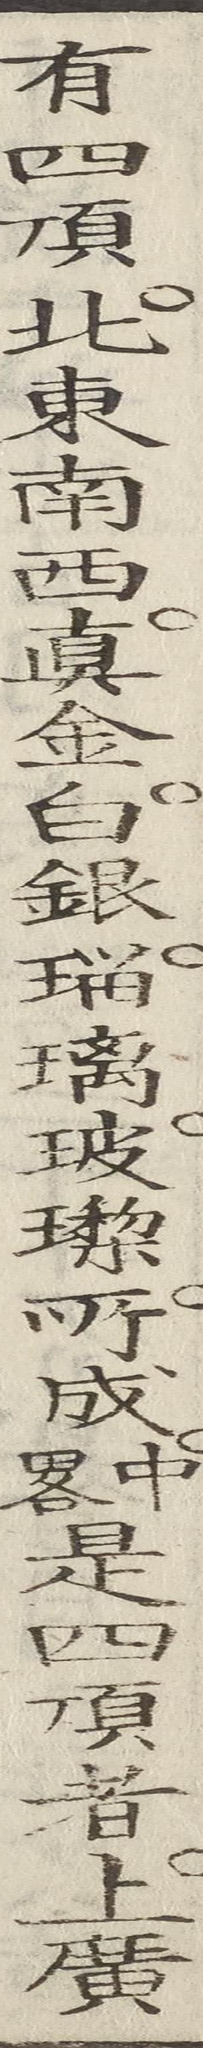有四頂。北東南西。真金。白銀。瑠璃。玻瓈。所成。中略是四頂者。上広
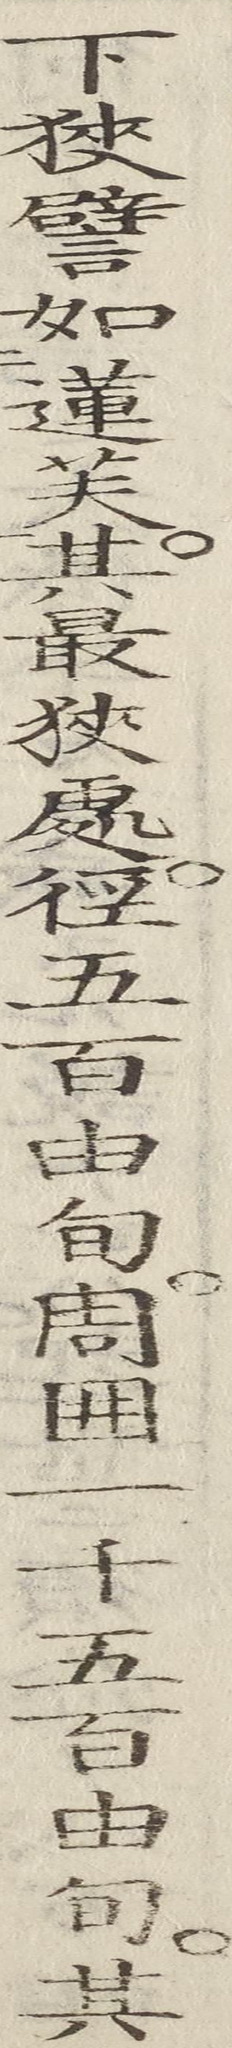下狭譬如ニ蓮芙。其最狭処。径五百由旬.周囲一千五百由旬。其
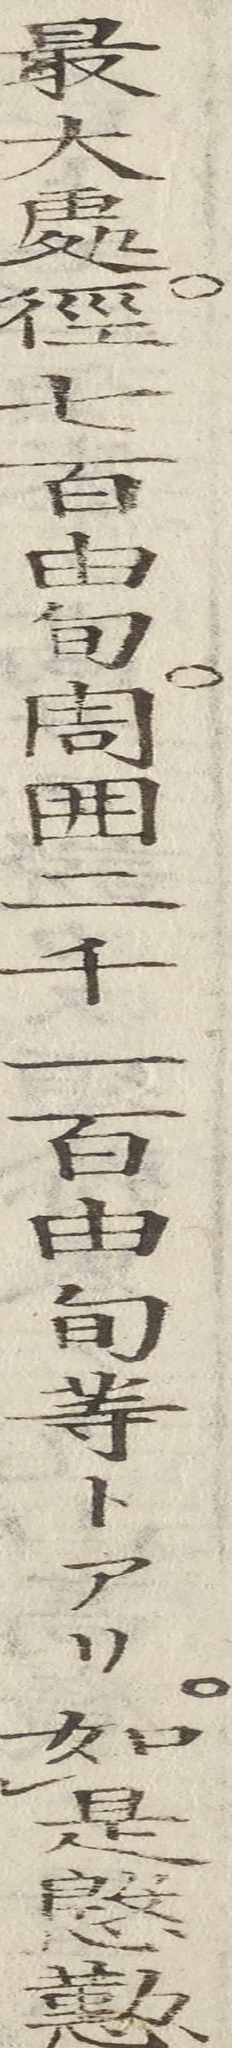最大処。径七百由旬。周囲二千一百由旬等トアリ。如是慇懃
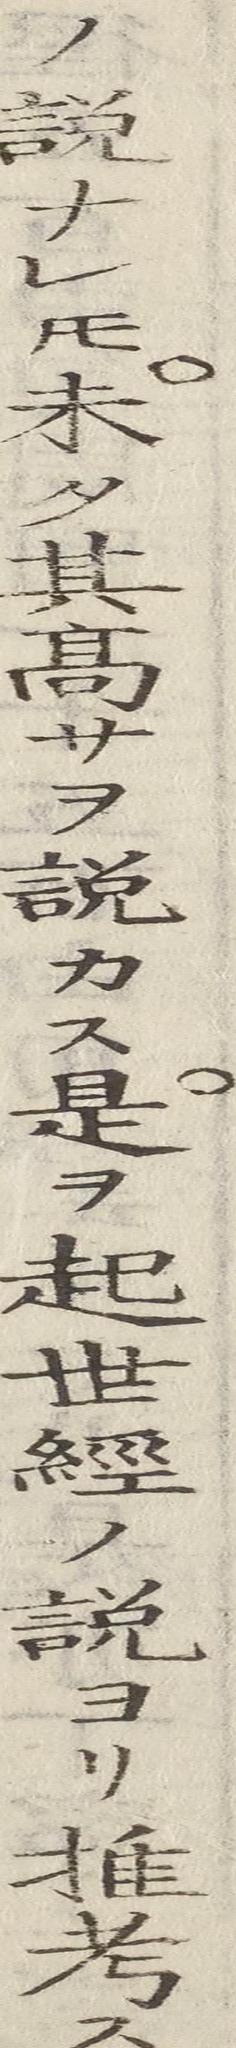ノ説ナレトモ。未タ其高サヲ説カス。是ヲ起世経ノ説ヨリ推考ス
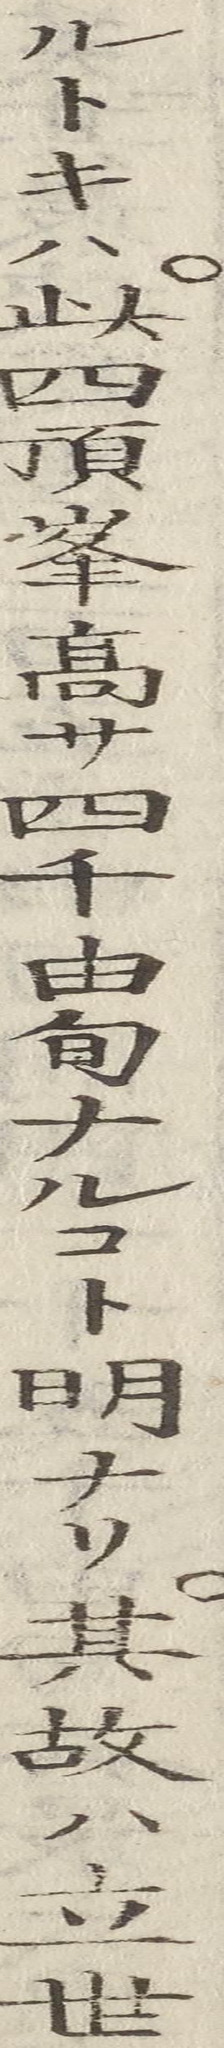ルトキハ。此四頂峯高サ四千由旬ナルコト明ナリ。其故ハ立世
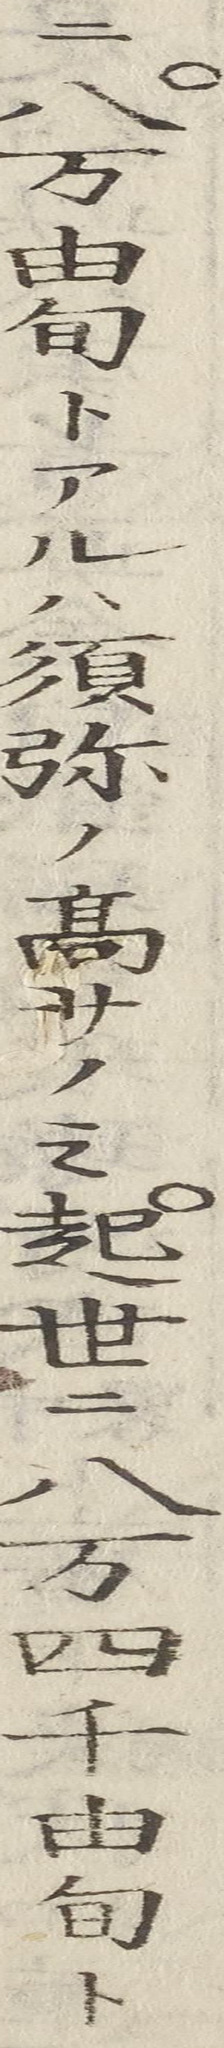ニ。八万由旬トアルハ須弥ノ高サノミ。起世ニ八万四千由旬ト
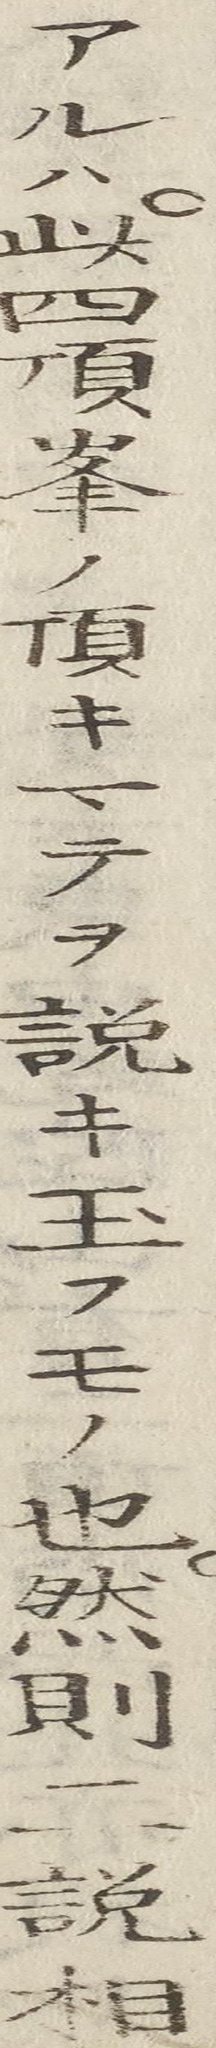アルハ。此四頂峯ノ頂キマテヲ説キ玉フモノ也。然則ニ説相
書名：護法新論　二編　上
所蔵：東京大学地震研究所図書室 Earthquake Research Institute Library, The University of Tokyo, JAPAN
